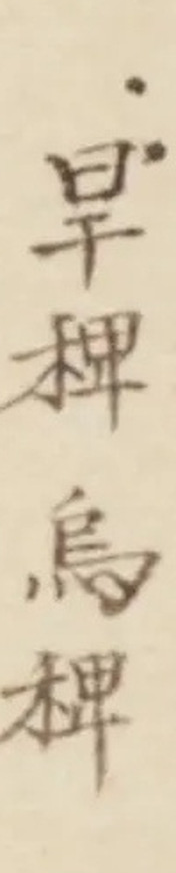早稗烏稗
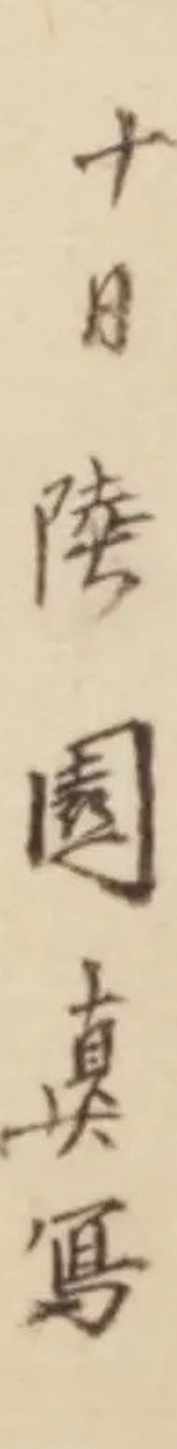十日陸園真寫
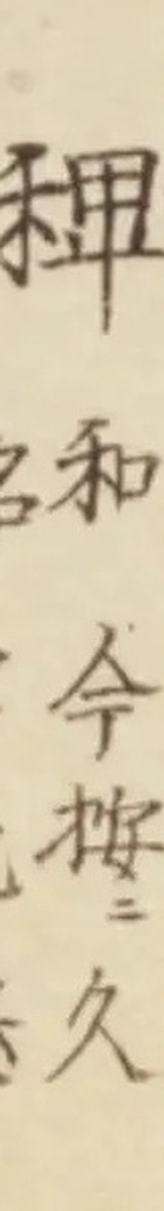稗和今按に久
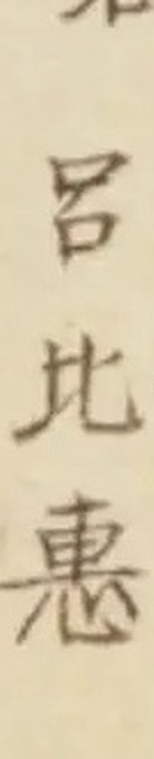名呂比恵
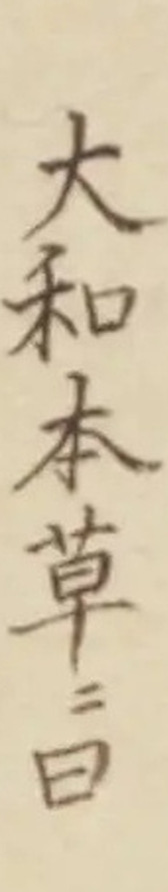大和本草に曰
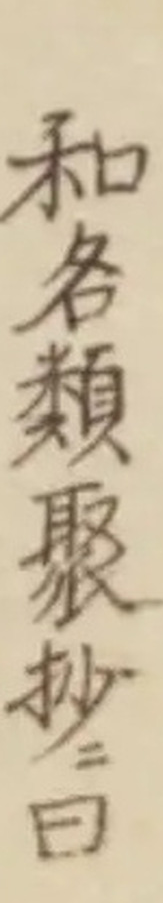和名類聚抄ニ曰

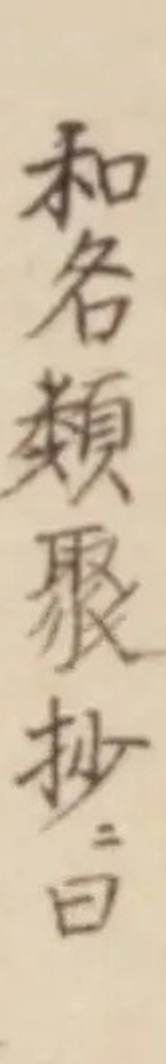和名類聚抄ニ曰
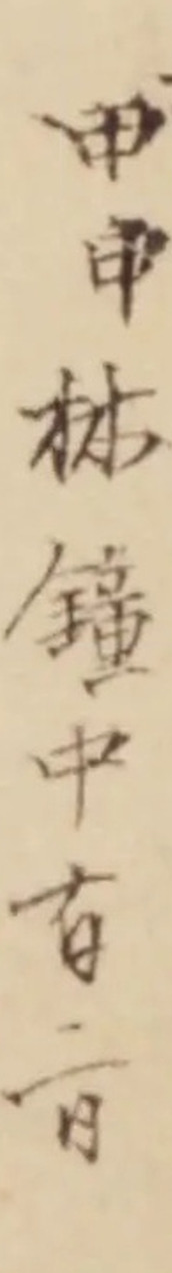甲申林鐘中有二日日
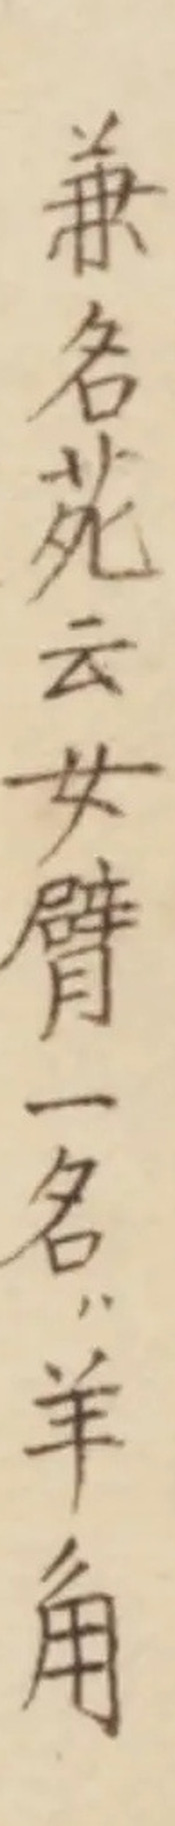白瓜兼名苑云女臂一は羊角
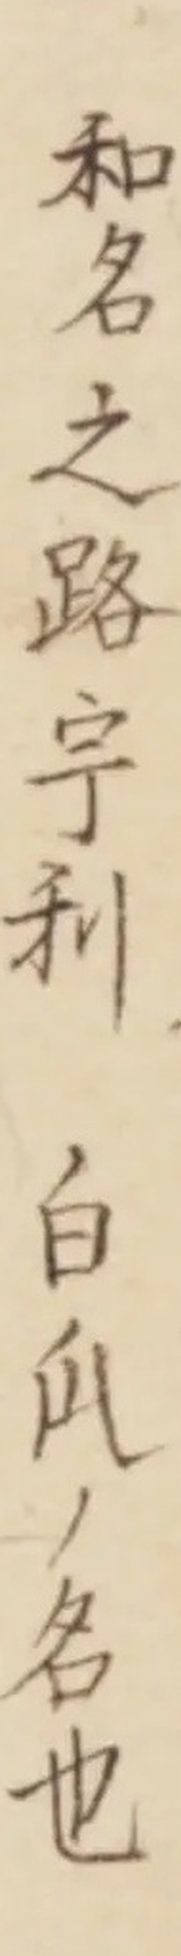和名之路宇利白瓜の名也
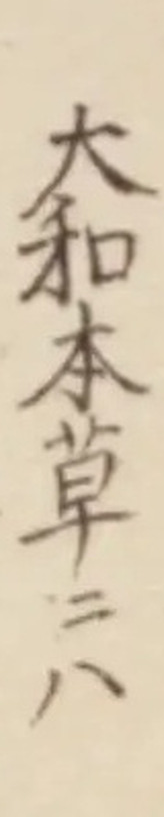大和本草に曰
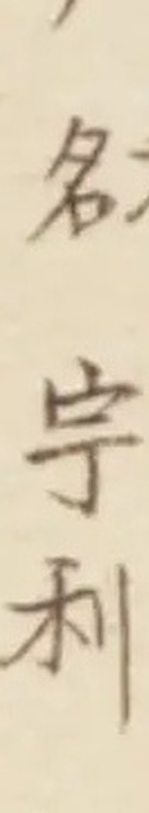名宇利
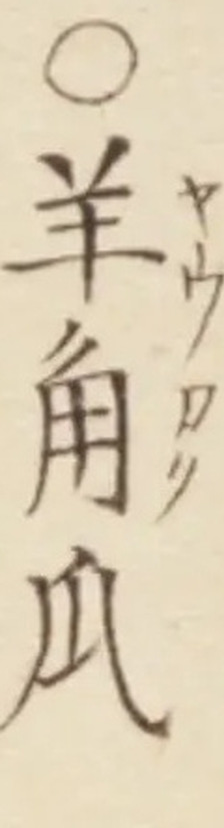〇羊角瓜
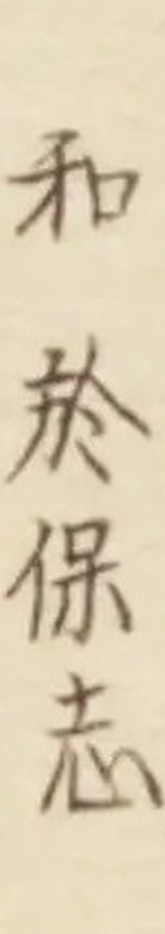和於保志
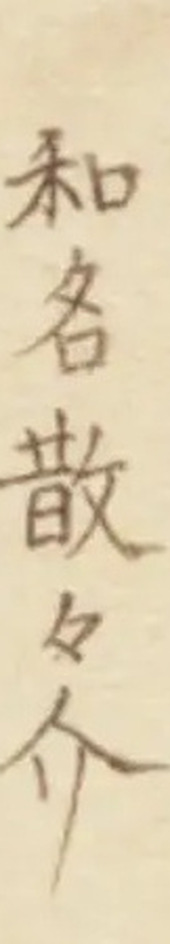和名散々介
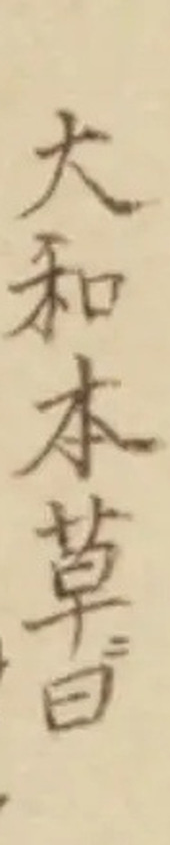大和本草に曰
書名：梅園草木花譜夏之部. 2
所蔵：国立国会図書館 National Diet Library, JAPAN
